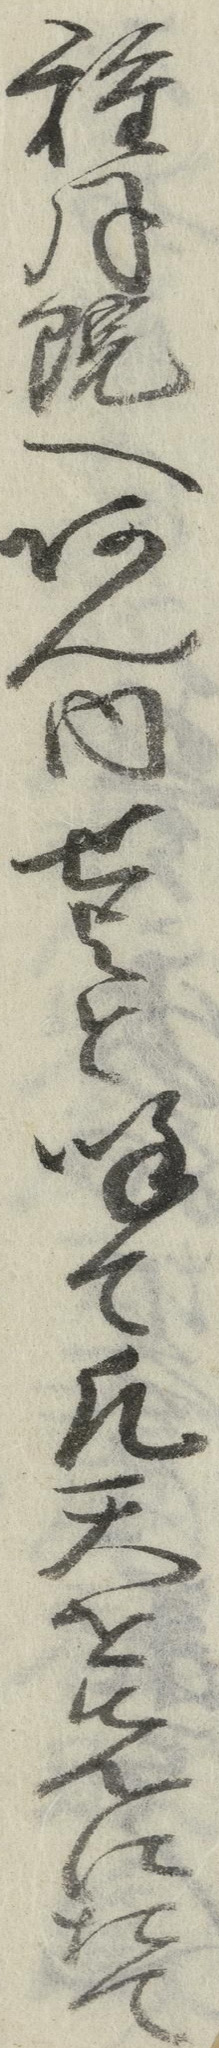種月院へあん内せよと呼て凡天を先にたて
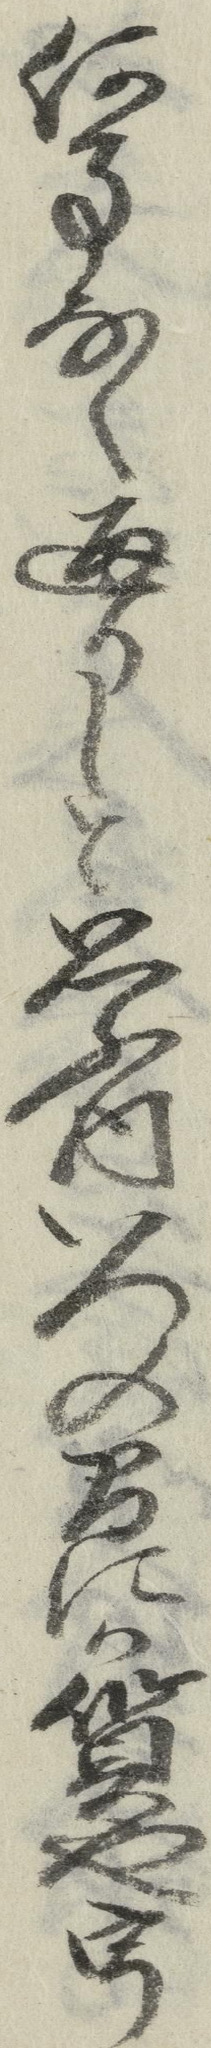何事なく通りしと思ふ内いつの間にか質や宇
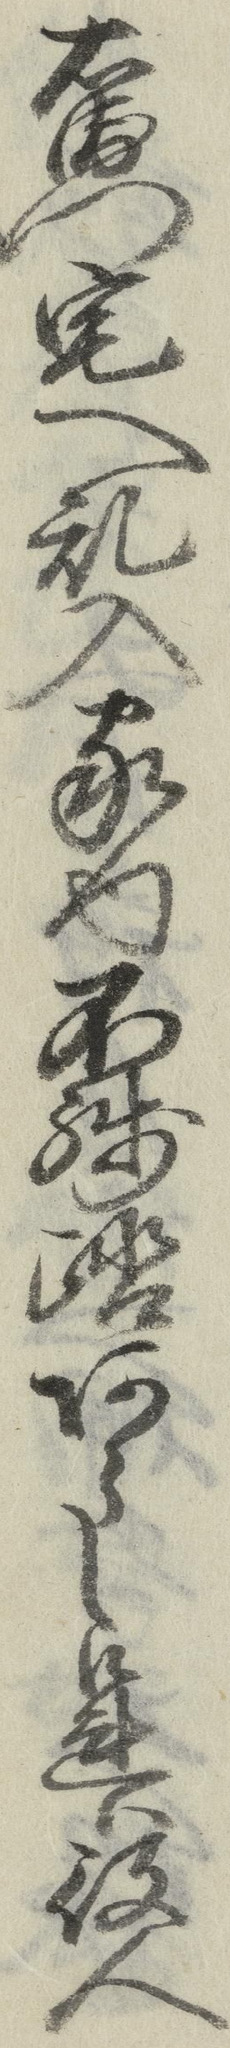右衛門宅へ乱入家内不残踏あらしけれは役人

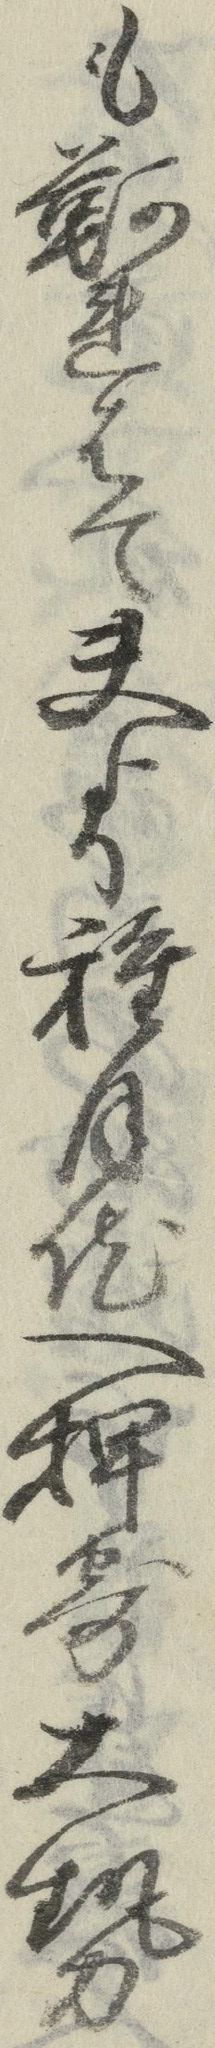も勒？れはて夫より種自然へ押寄大勢
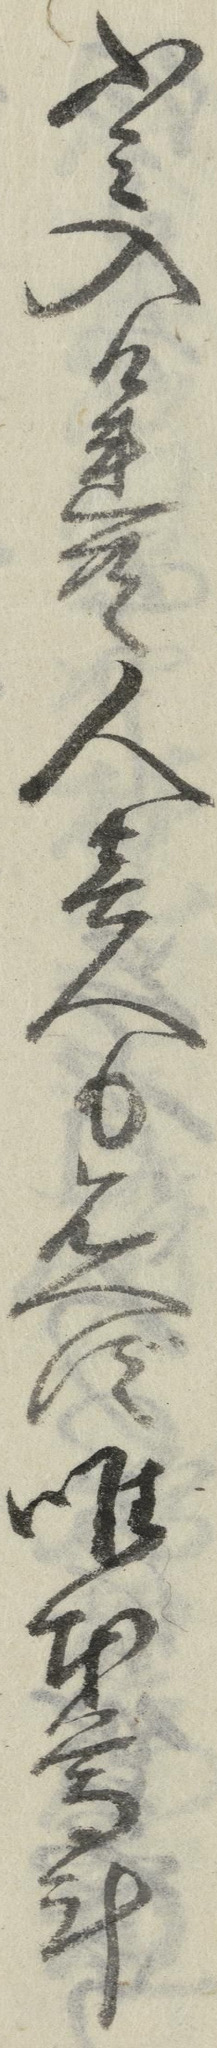ふみ入けれ共人壱人も見へず唯本尊計
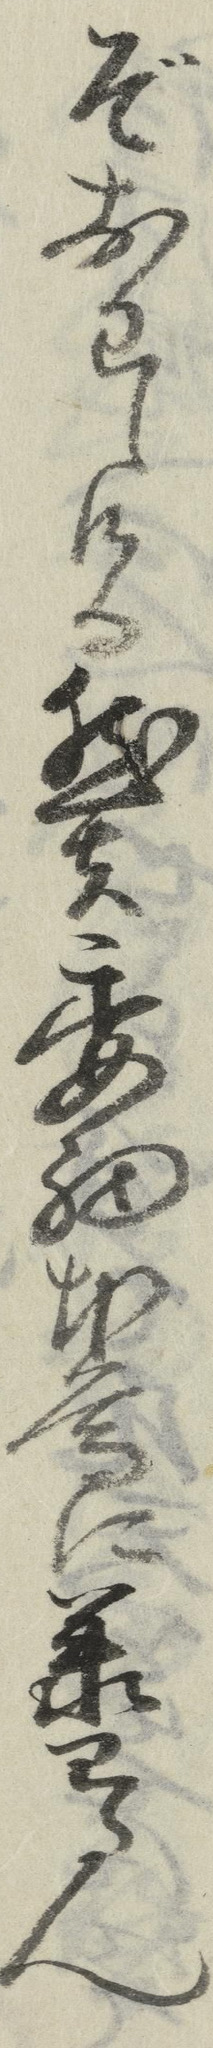ぞおわしける然は委細本尊に承わらん
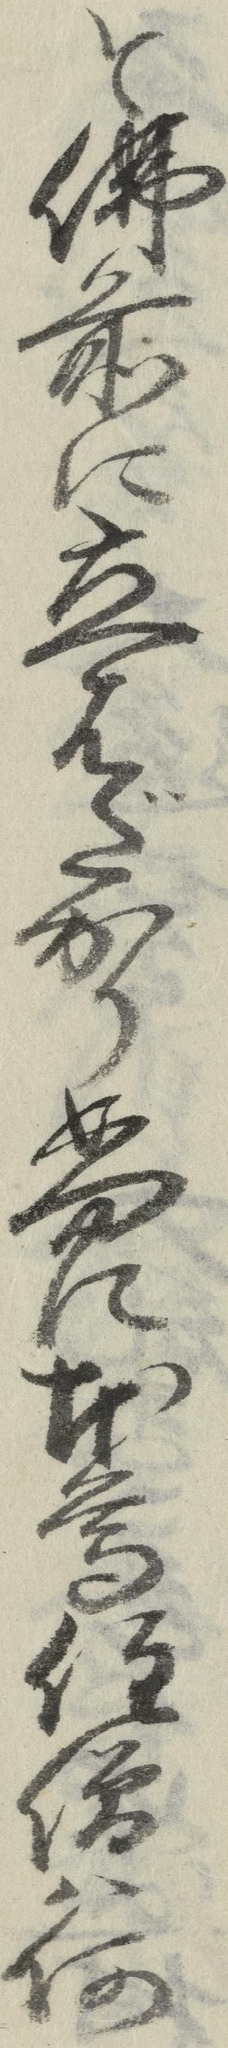と仏前に立はだかり如何に本堂住僧は何
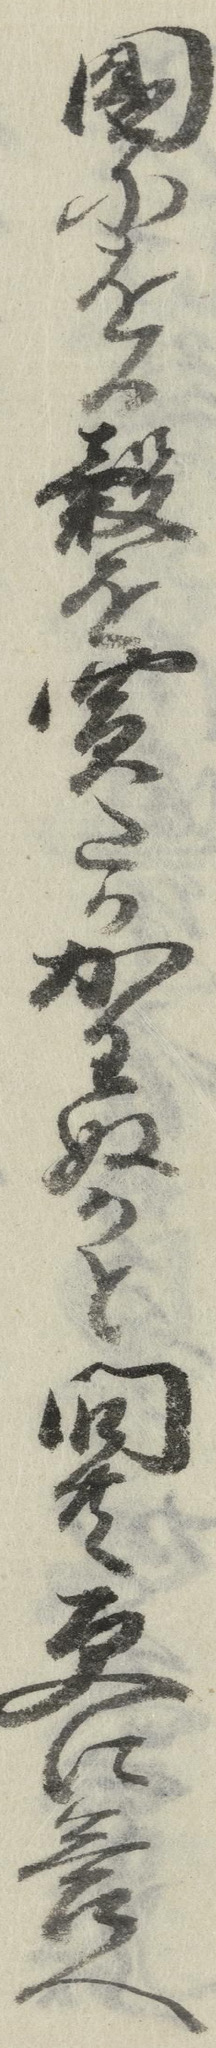国に懸る穀を買たかかわぬかと問共更に答へ
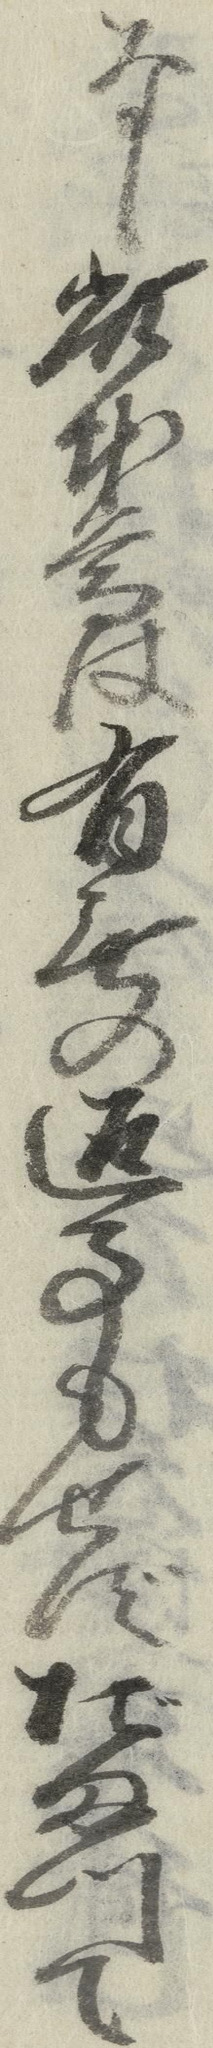なし此本尊は有無の返事もせずだまつて
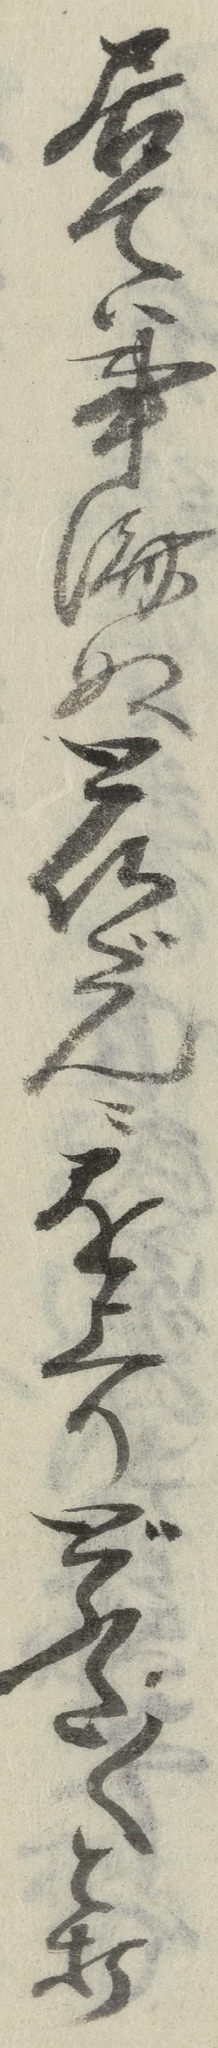居てハ事済ぬと仏だんに懸上りどふた〳〵と打
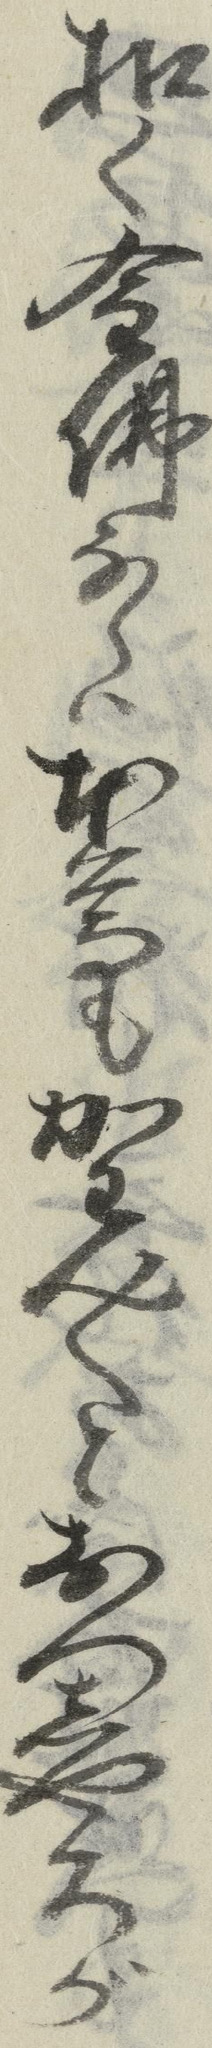扣く金仏ならは本尊もかわん〳〵とおつしやろが
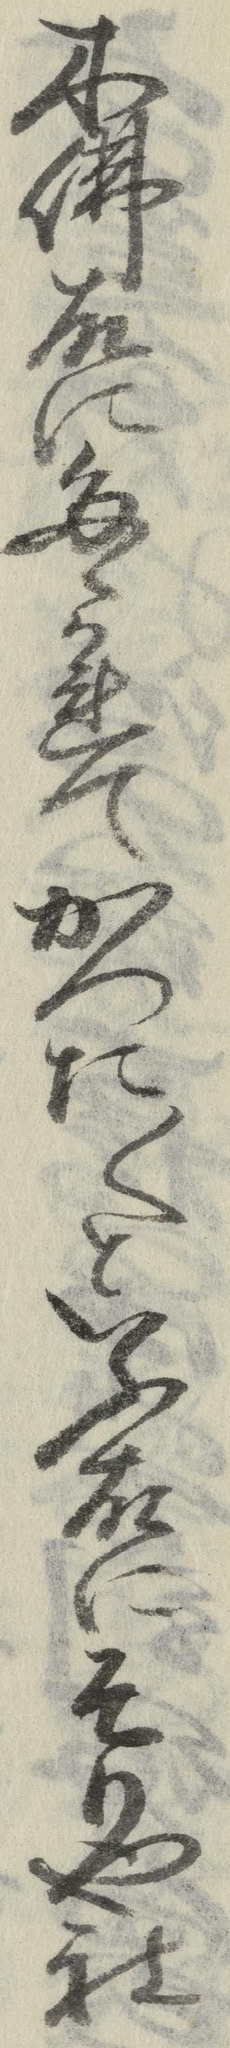木佛故にたゝかれてかつた〳〵といふ故にそりや社
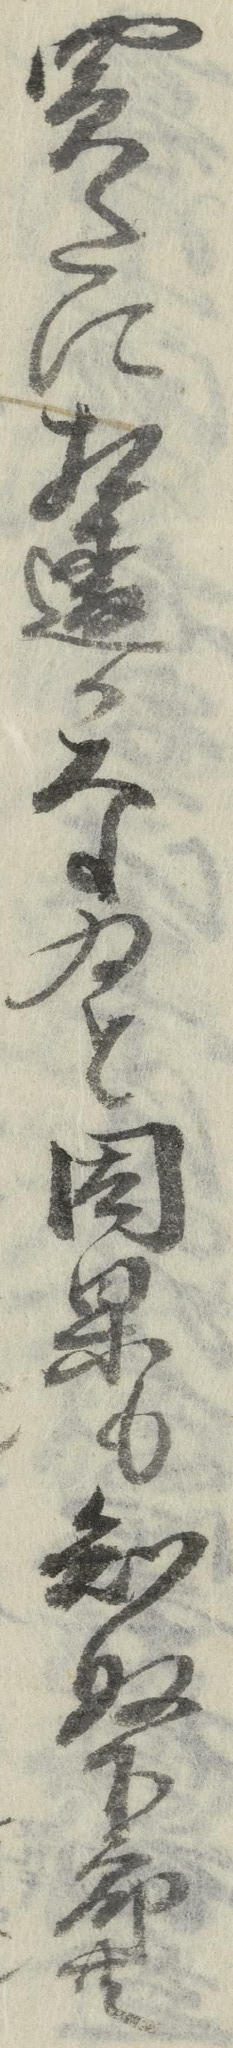買たに相違かなゐと因果も知ぬ下郎共
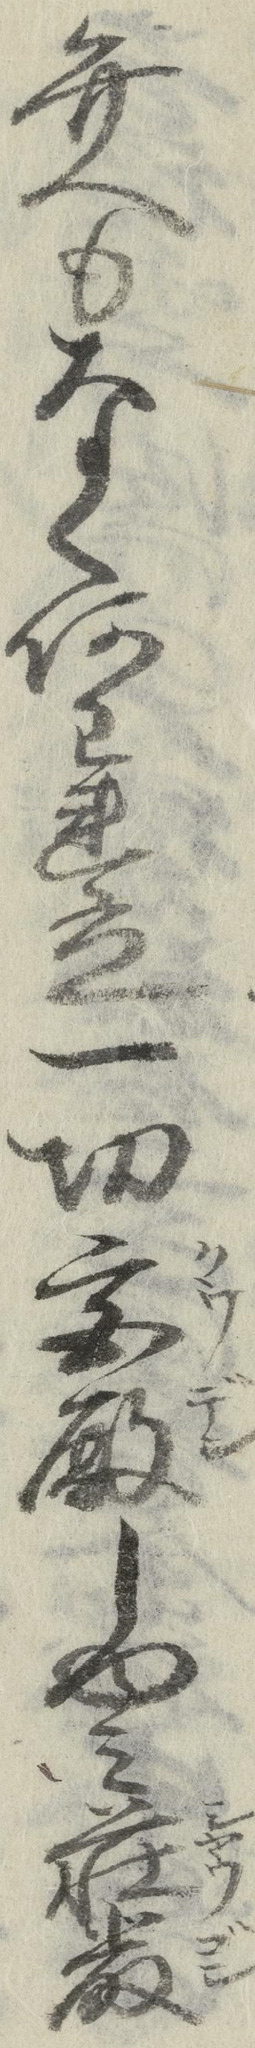弁人もなくあわれ立一切宮殿しゆみ荘厳
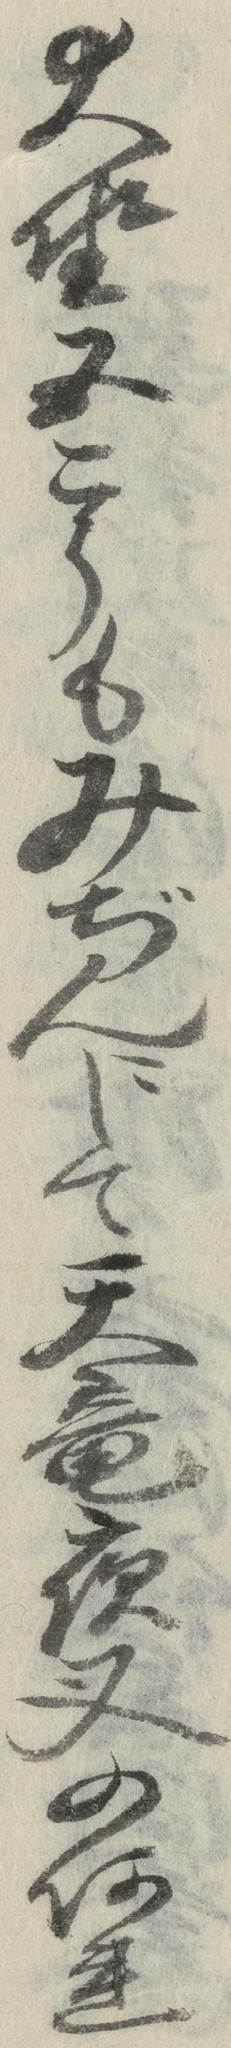大野五こうもみぢんにして天竜夜叉のあれ
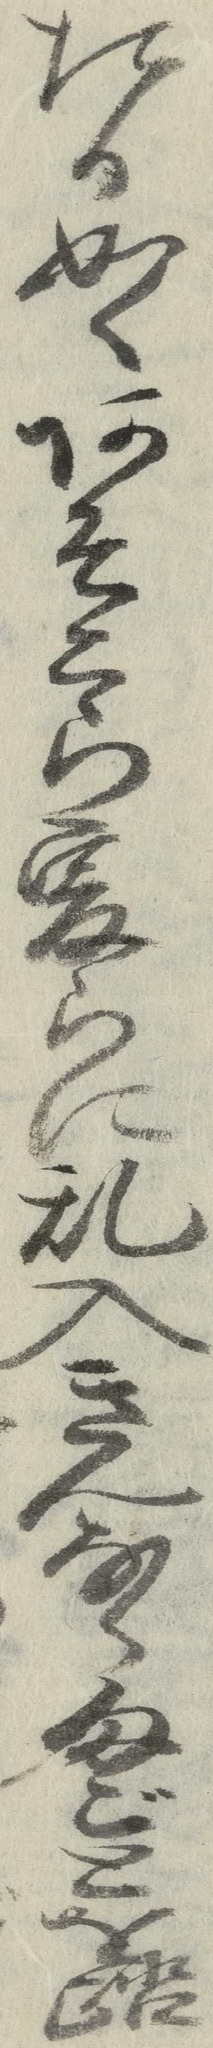たか如くあそこら爰らに乱入きんならまごとを踏
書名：浅間大焼騒動記　中
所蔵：東京大学地震研究所図書室 Earthquake Research Institute Library, The University of Tokyo, JAPAN
